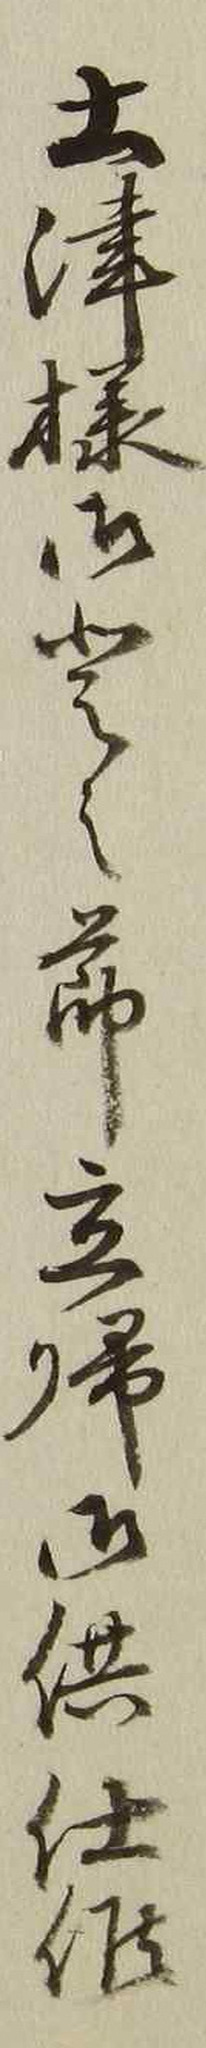土津様御登之節立帰御供仕候
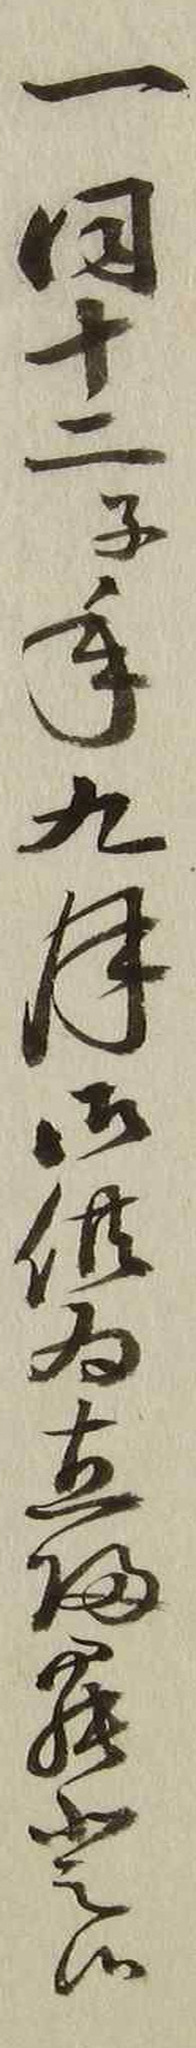一同十二子年九月御供為立帰罷登候
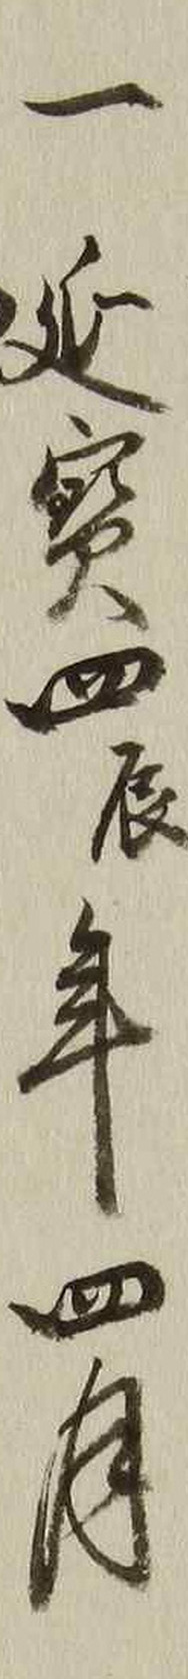一延宝四辰年四月
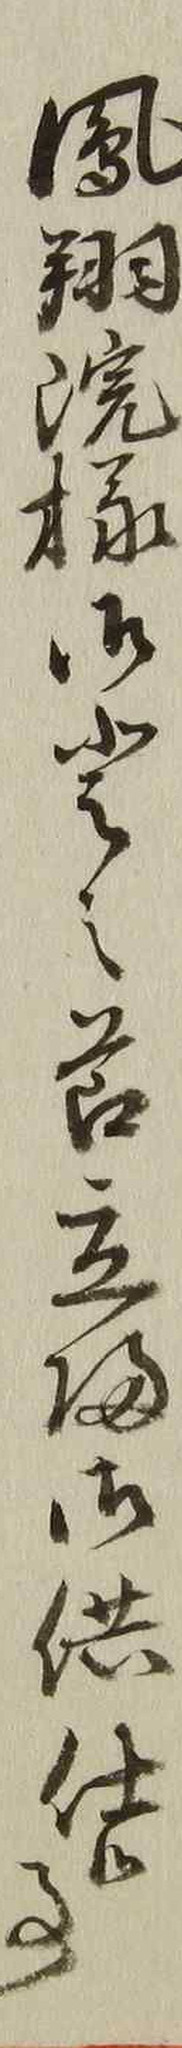鳳翔院様御登之節立帰御供仕候事
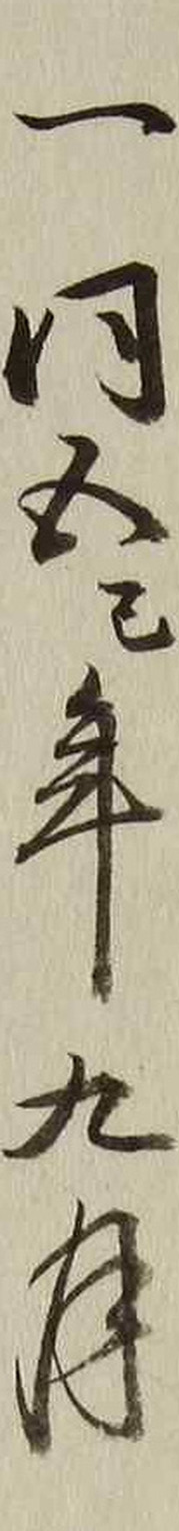一同五巳年九月
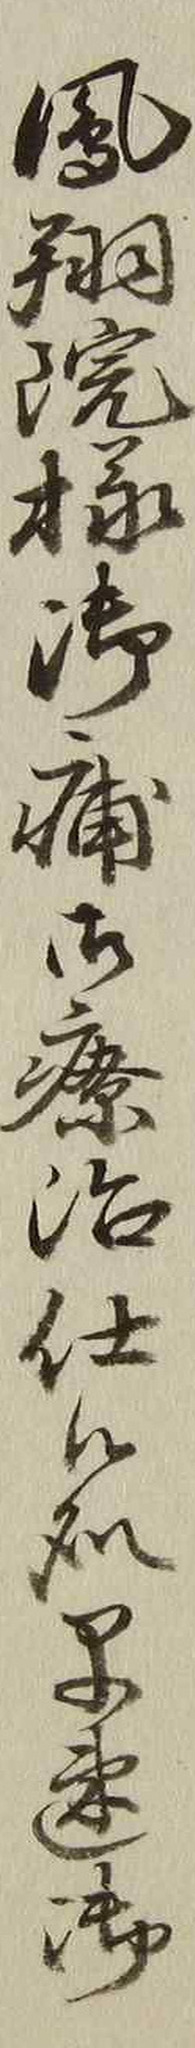鳳翔院様御痛御療治仕候処早速御
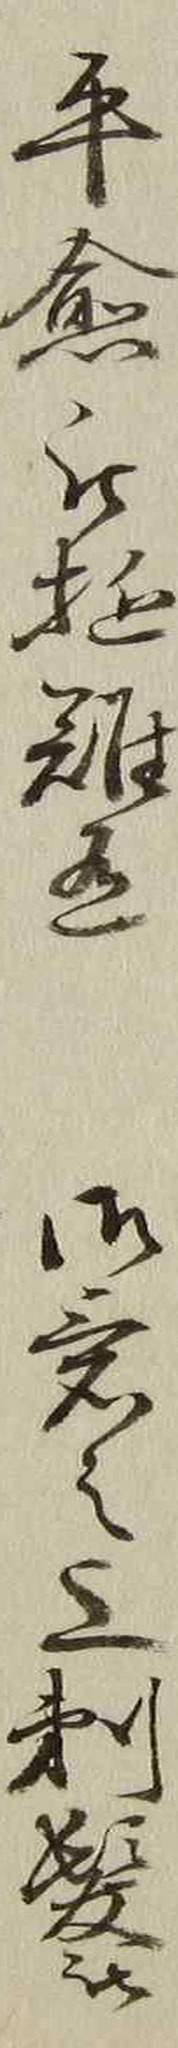平愈被遊難有御意之上剃髪被
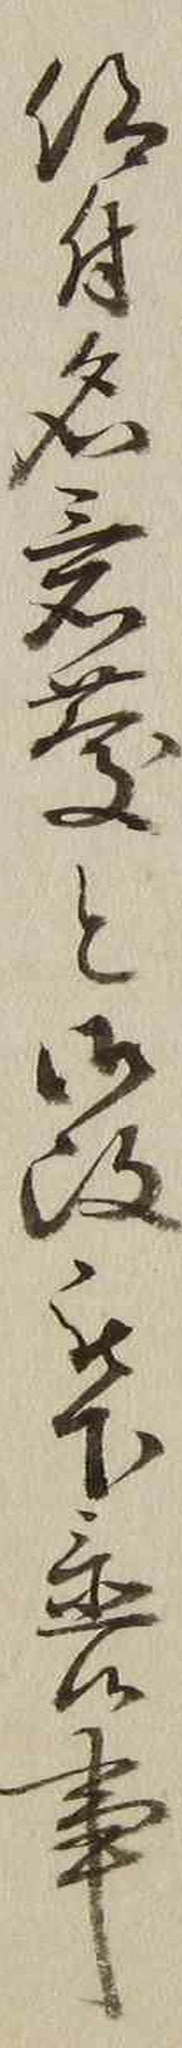仰付名意慶と御改被下置候事
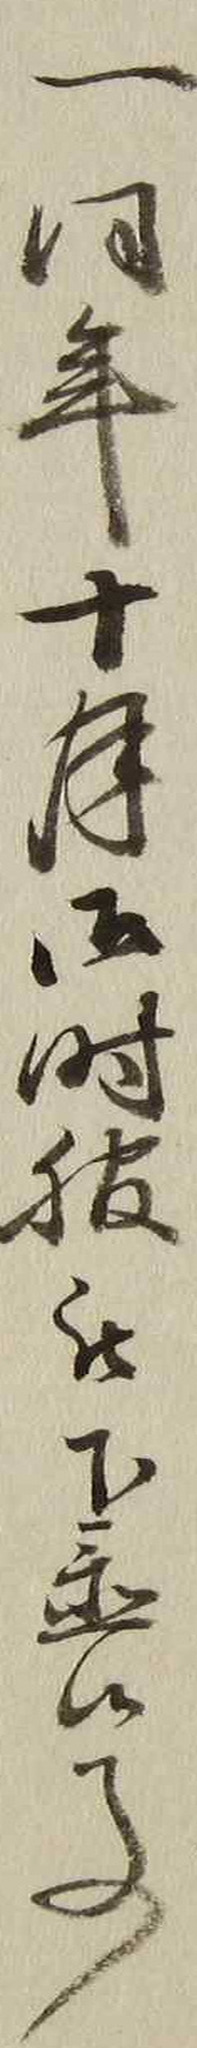一同年十月御時服被下置候事
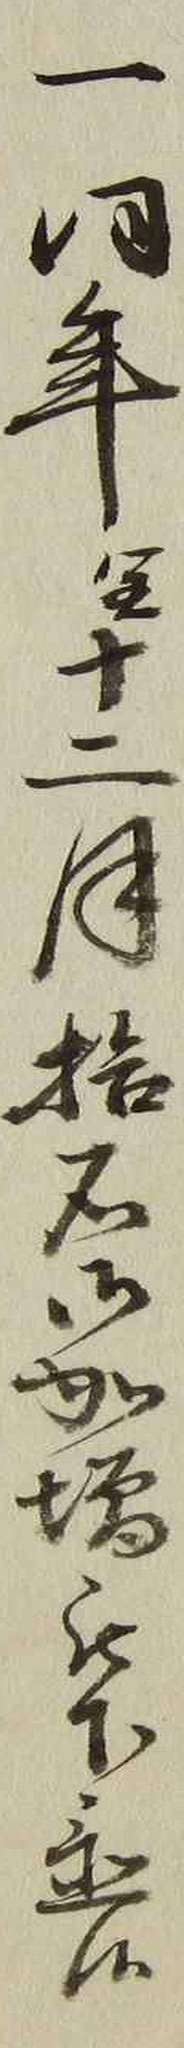一同年閏十二月拾石御加増被下置候
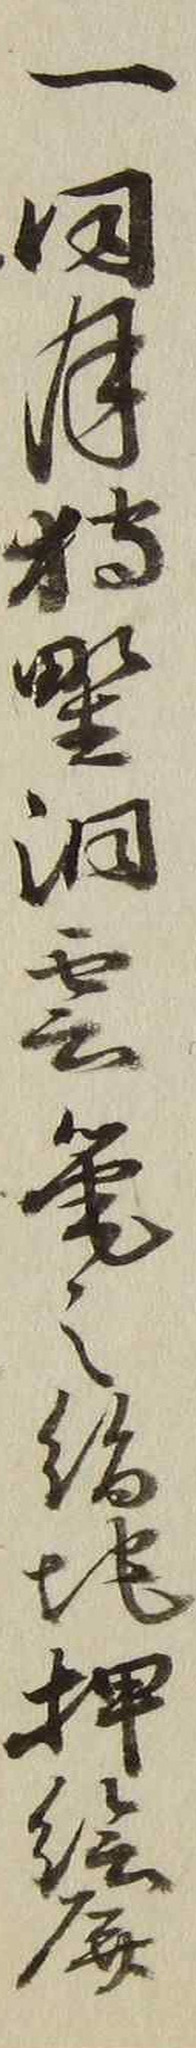一同月狩野洞雲筆之絹地押絵屏
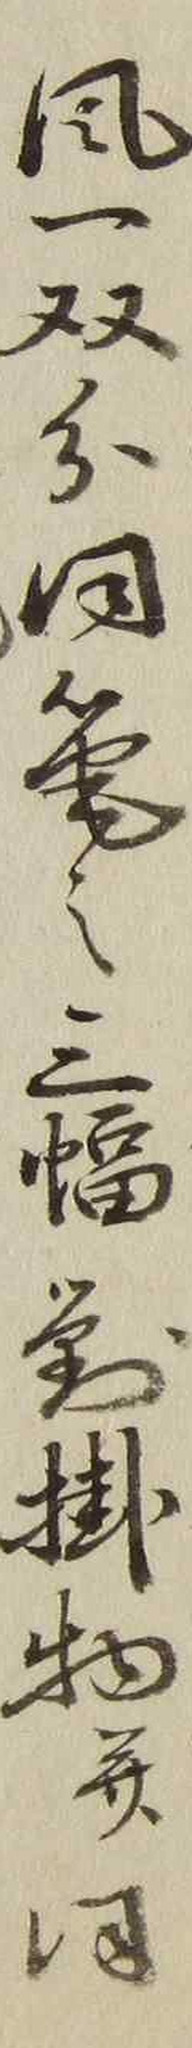風一双分同筆之三幅対掛物并同
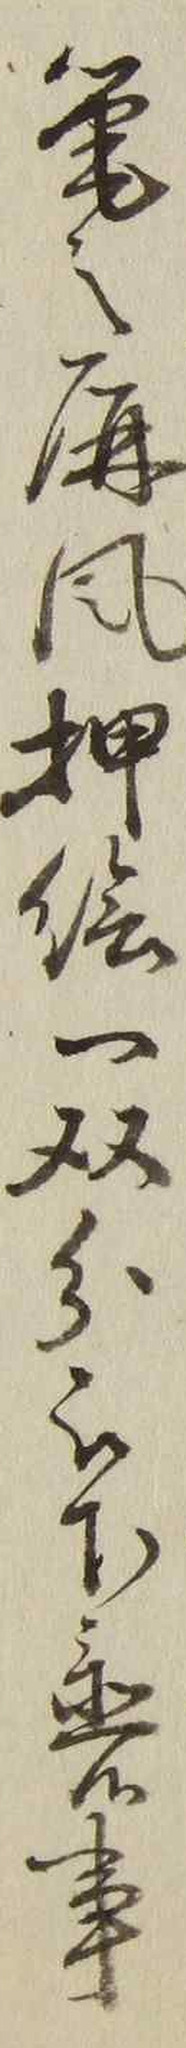筆之屏風押絵一双分被下置候事

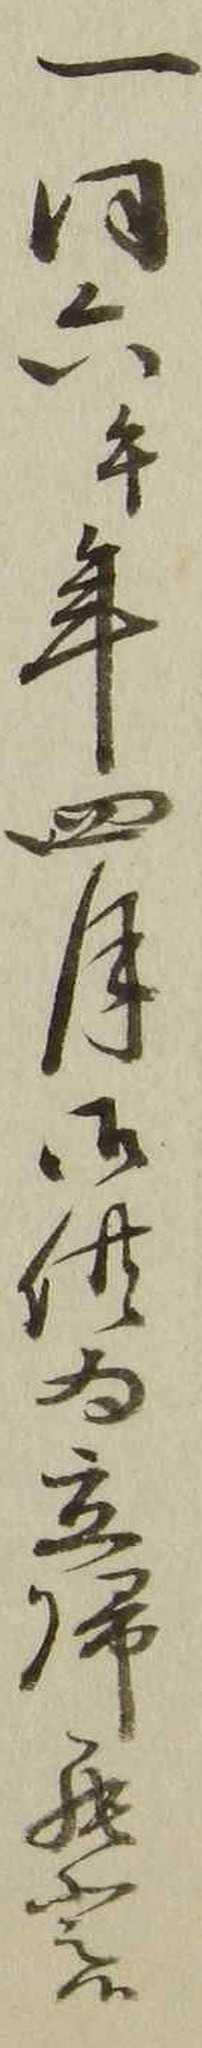一同六午年四月御供為立帰罷登候
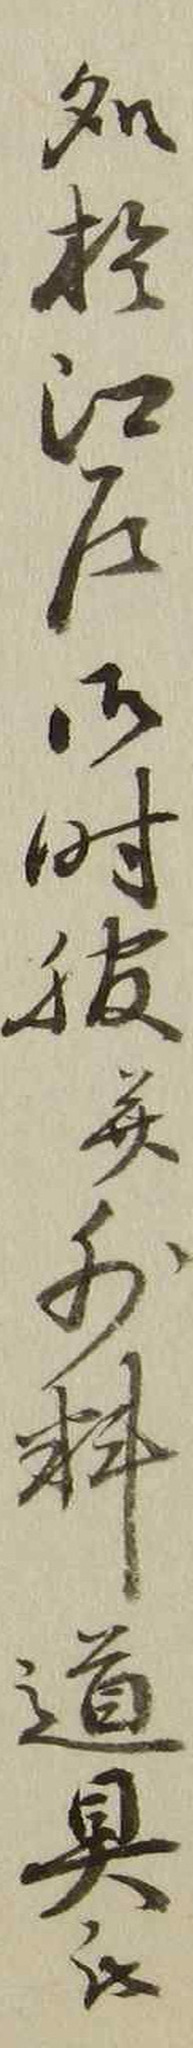処於江戸御時服并外料道具被
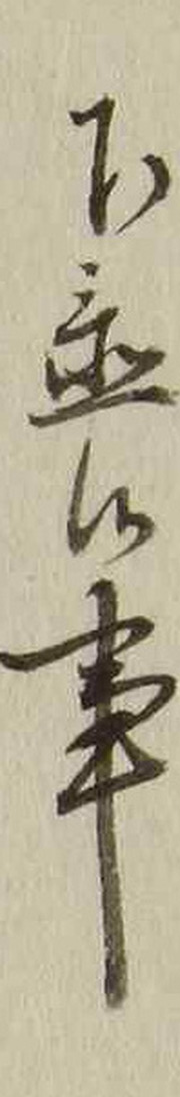下置候事
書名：諸士系譜　巻之31　い之部31
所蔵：会津若松市立会津図書館
